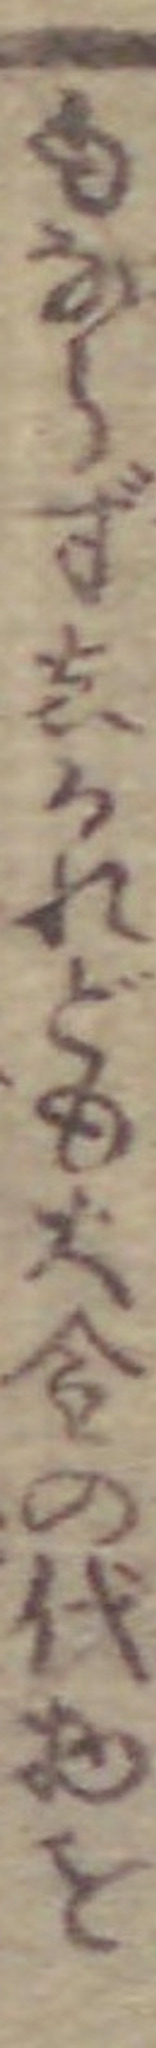もならずしかれども大金の代物を
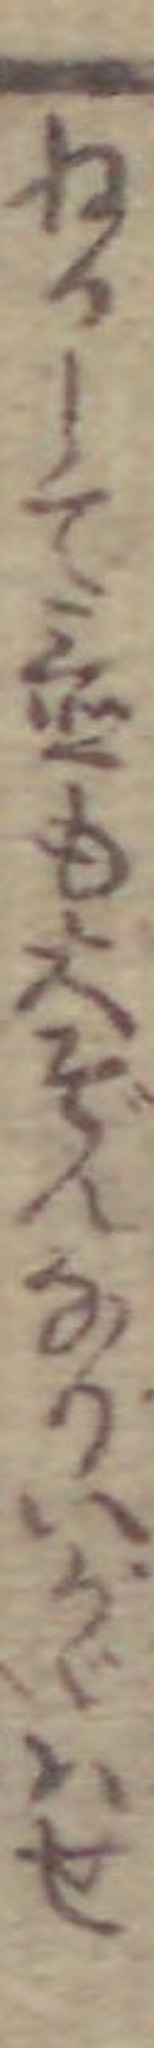ねかして置も大ぞんなりいかゞはせ
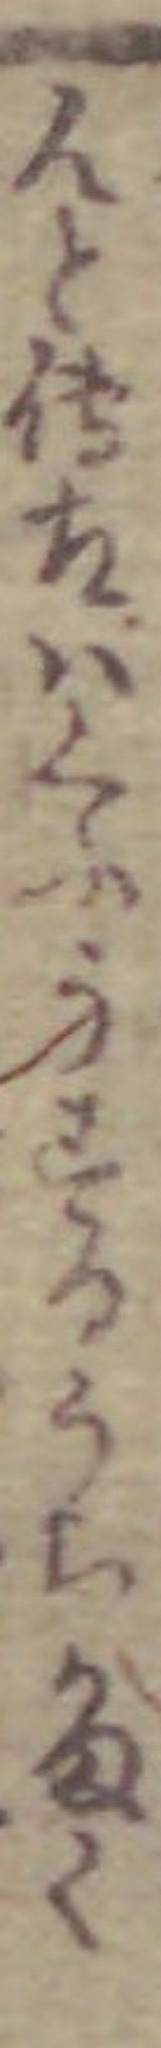んと傳左はくふうするうちかまく
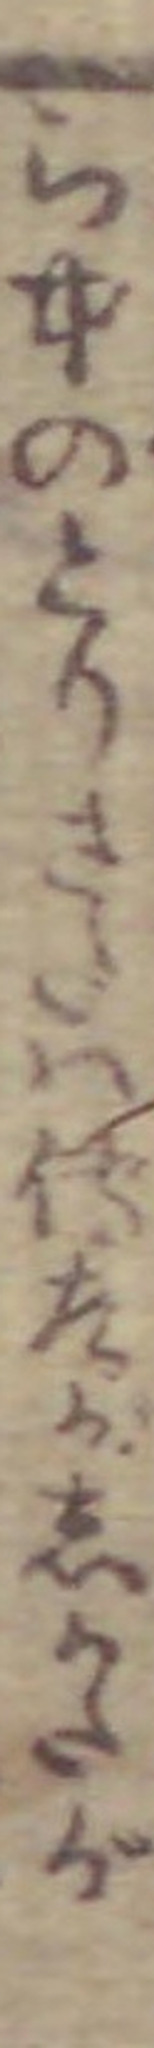ら中のとりさたは傳左かしかたが
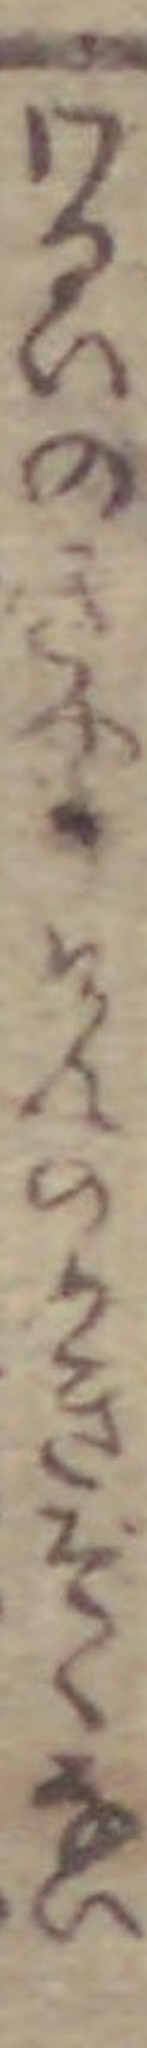わるいのきやうけんのかきぞくない
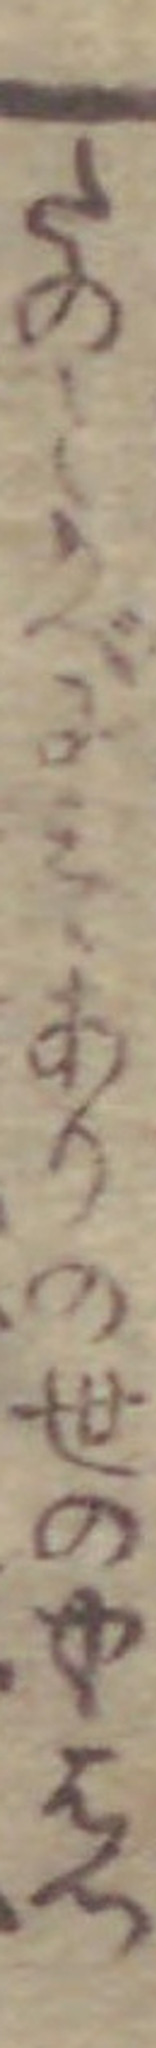たのとかべにみゝありの世の中はつ
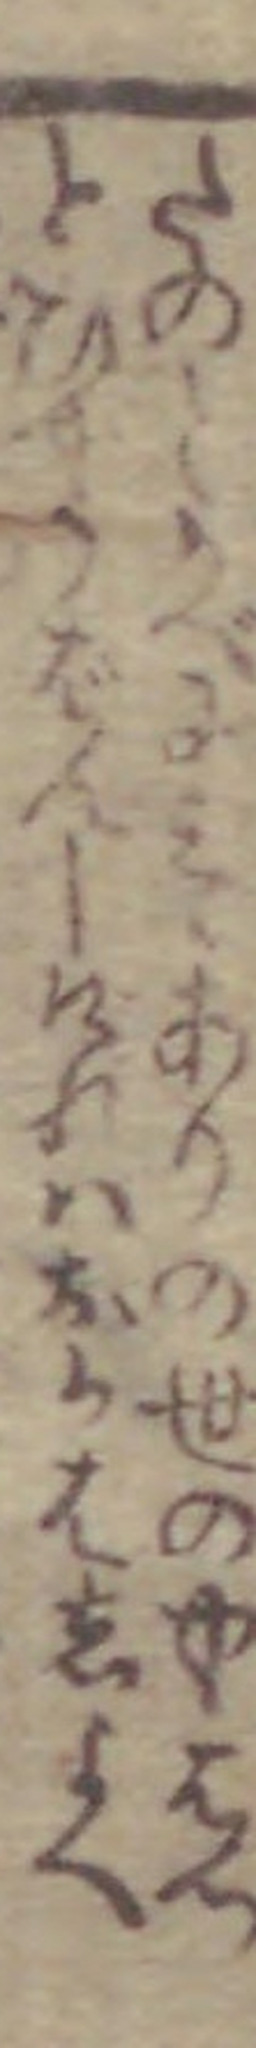とひやうばんしけれはおかはしよへ
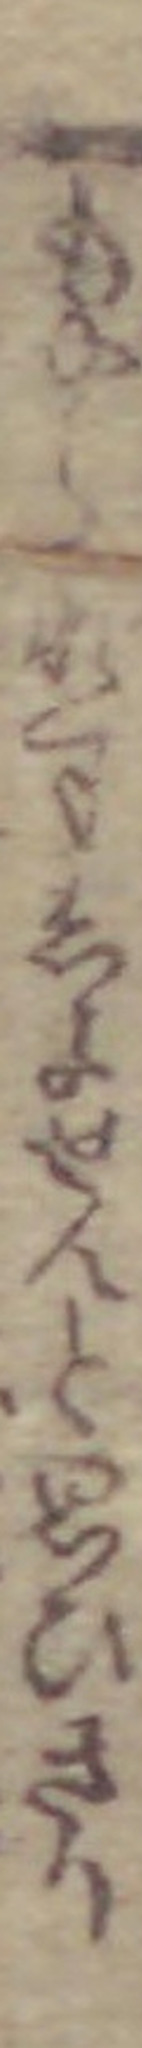もやられすしよせんと思ひきり
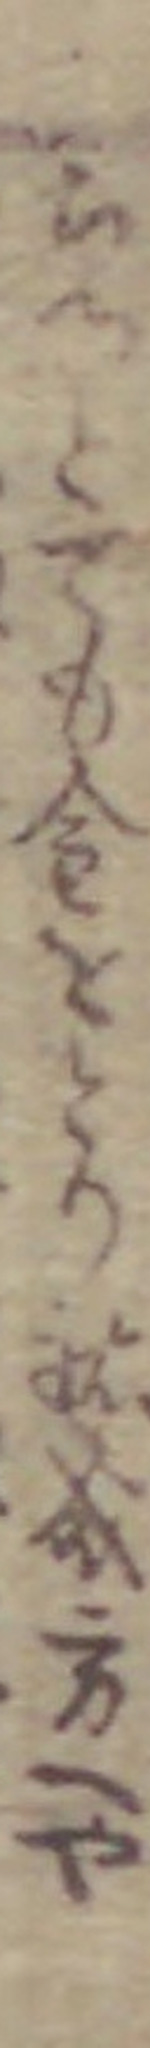ちつとても金をとり祐成方へや
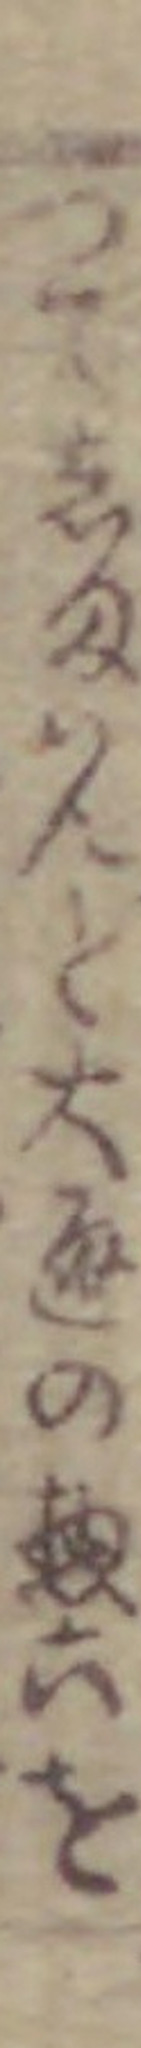つてしまはんと大通の惣六を
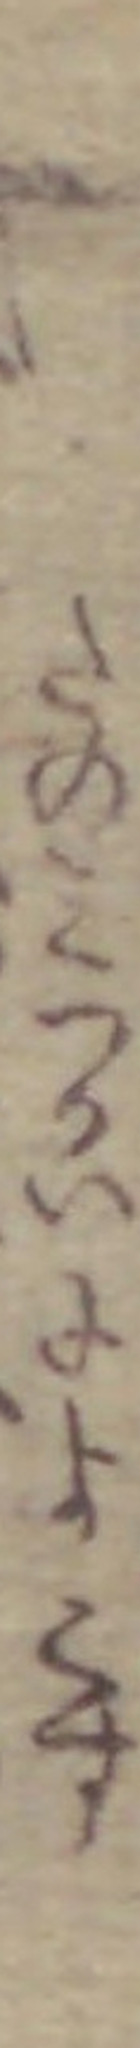たのみつかいによこす
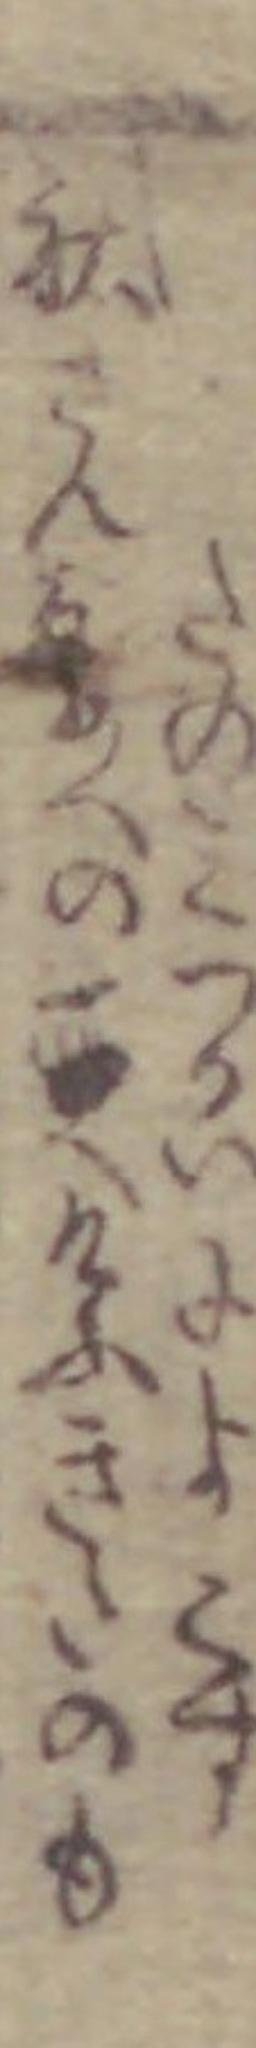「祐さんおめへの所へけふきたのも
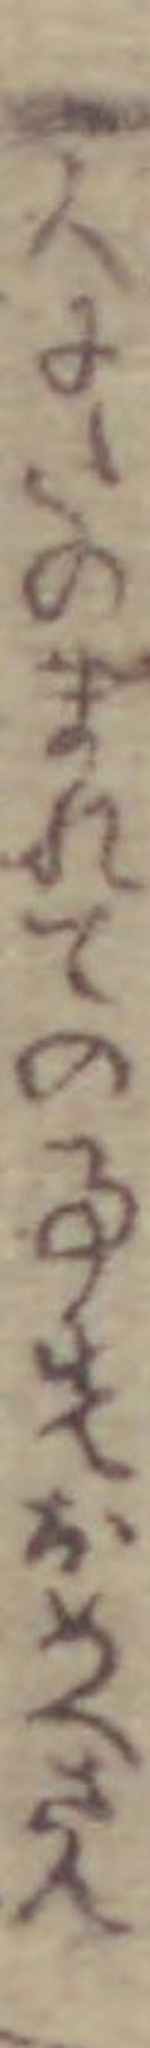人にたのまれての事先おめへさん
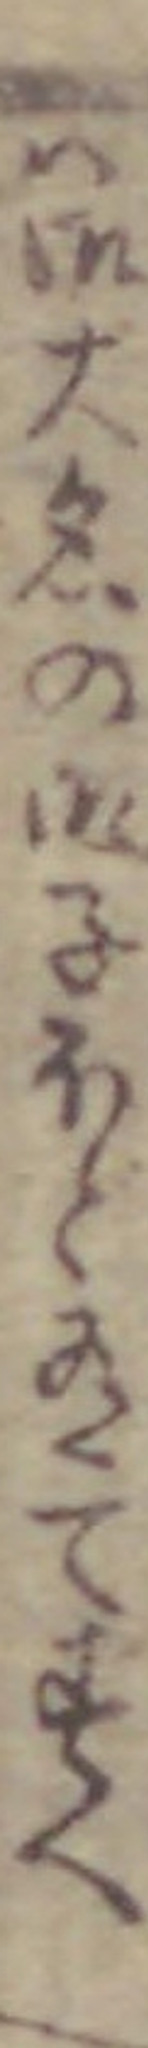は御大名の御子ほど有てすへ
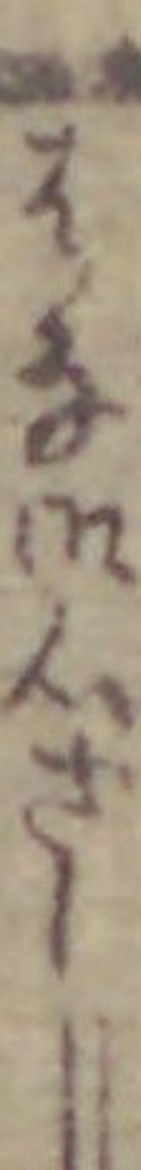はな御心ざし
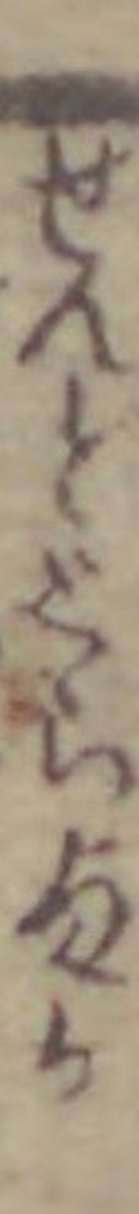せんととらさまか
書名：間似合嘘言曽我 3巻
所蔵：国立国会図書館 National Diet Library, JAPAN
